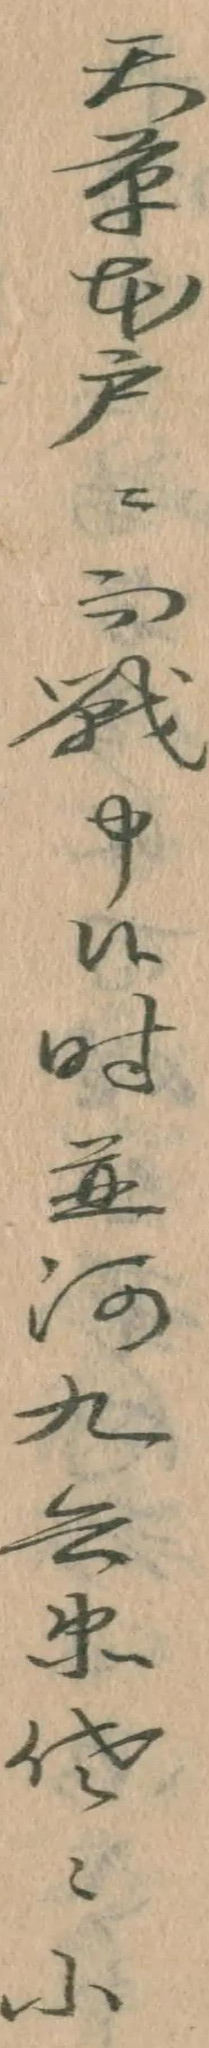一天草本戸に而戦申候時並河九兵衛佐に小
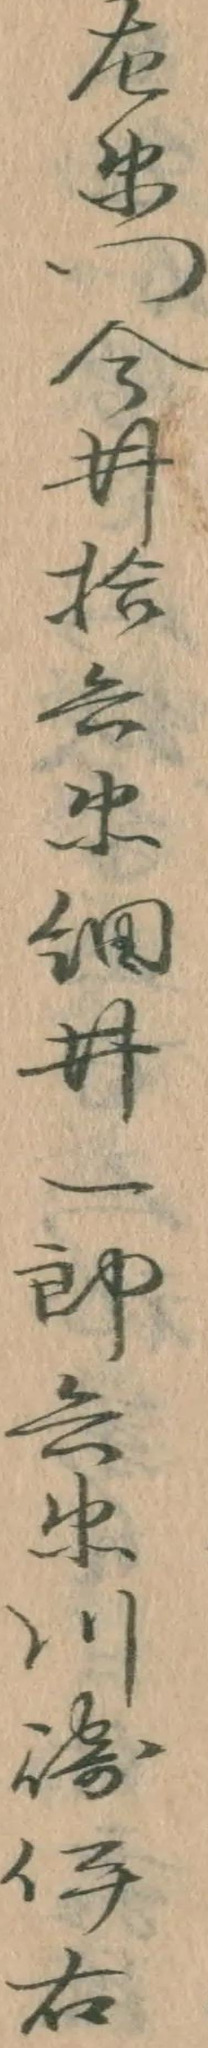左衛門今井拾兵衛細井一郎兵衛川崎伊右
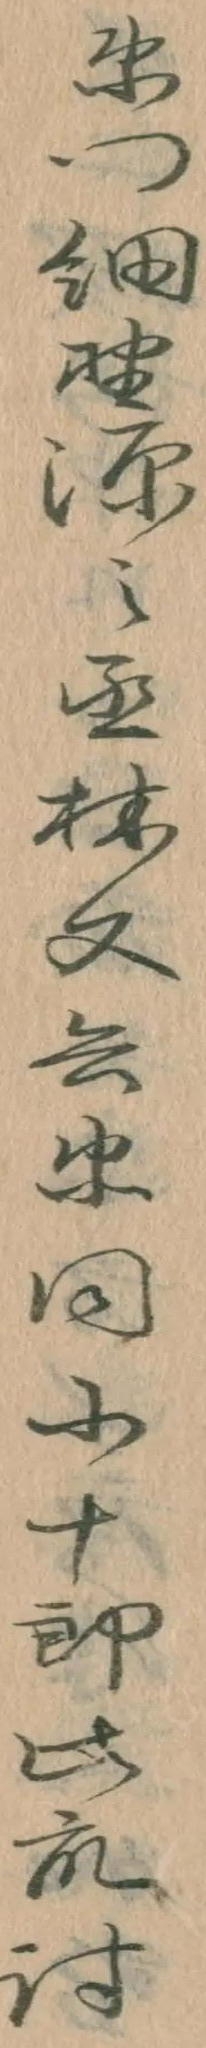衛門細野源之丞林又兵衛同小十郎此衆討
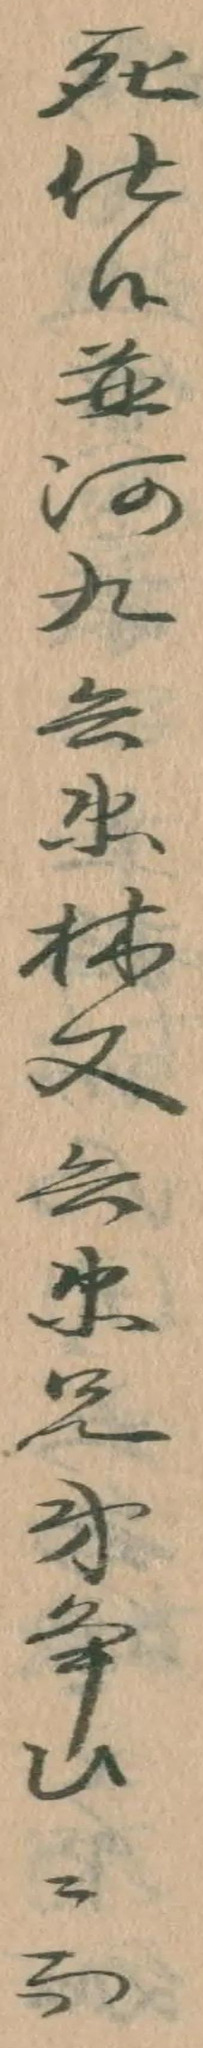死仕候並河九兵衛林又兵衛兄弟争ひに而
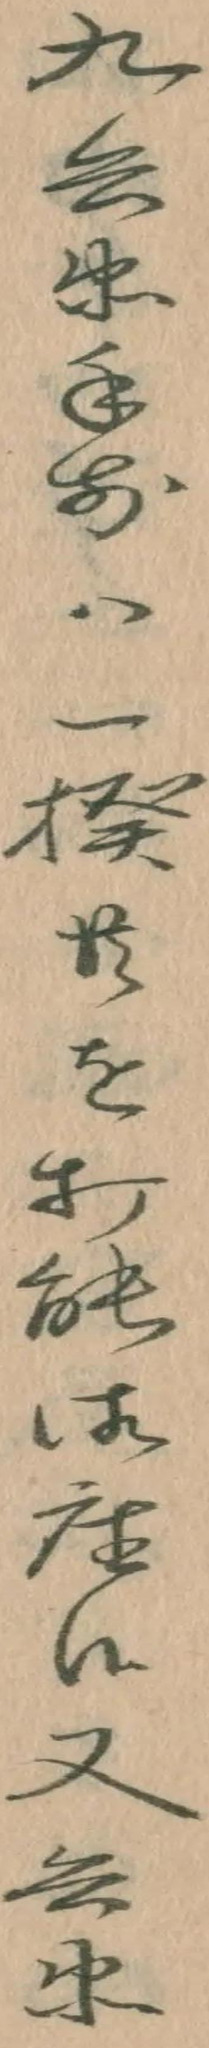九兵衛手前は一揆共を打能御座候又兵衛
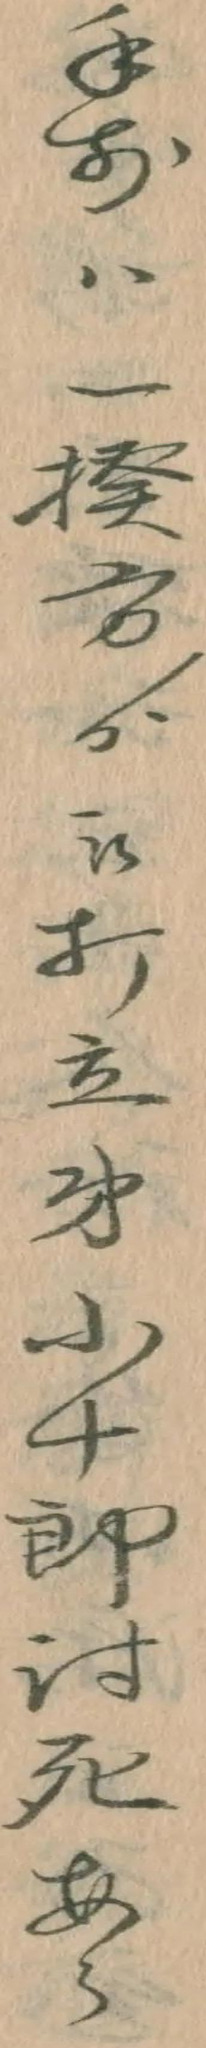手前は一揆方ゟ被打立弟小十郎討死あら
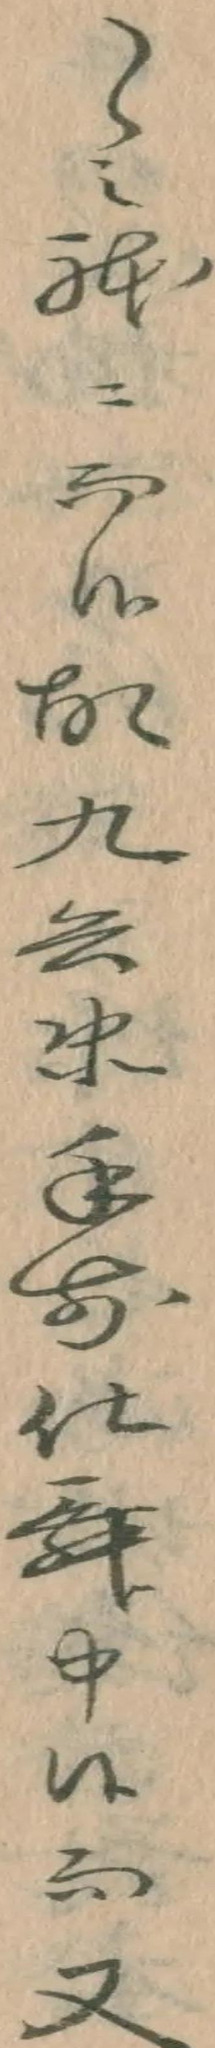〱之躰に而候故九兵衛手前仕舞申候而又
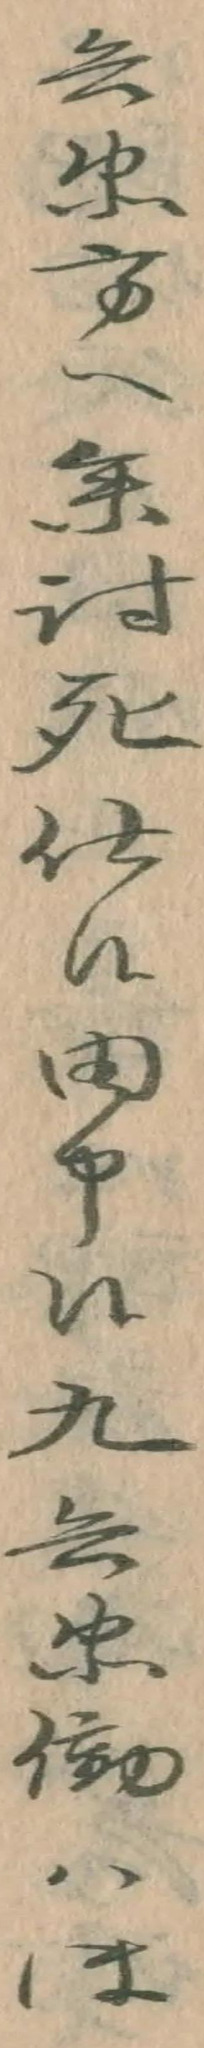兵衛方へ参討死仕候由申候九兵衛働はほ
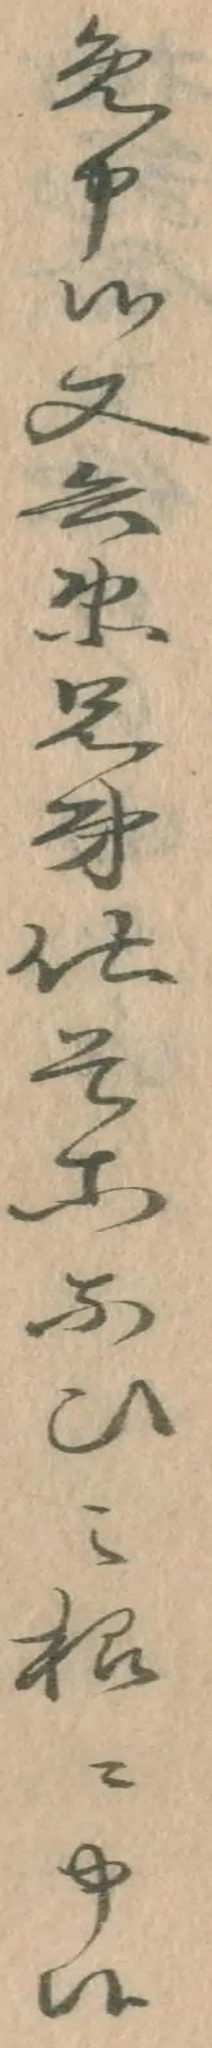免申候又兵衛兄弟仕そ古なひ之様に申候
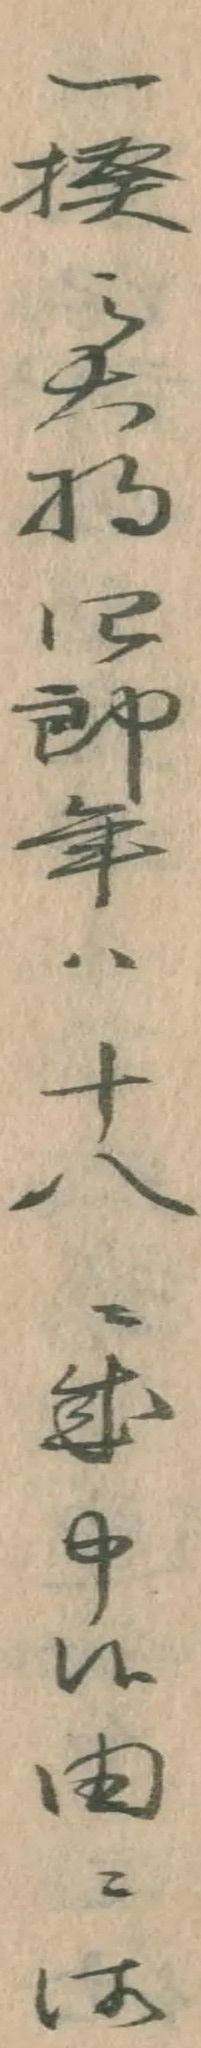一一揆之大将四郎年は十八に成申候由に御
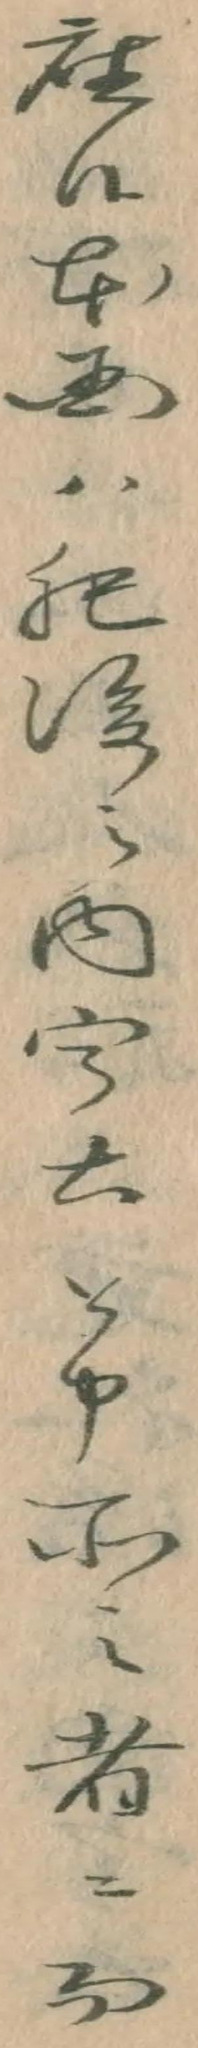座候本国は肥後之内宇土と申所之者に而
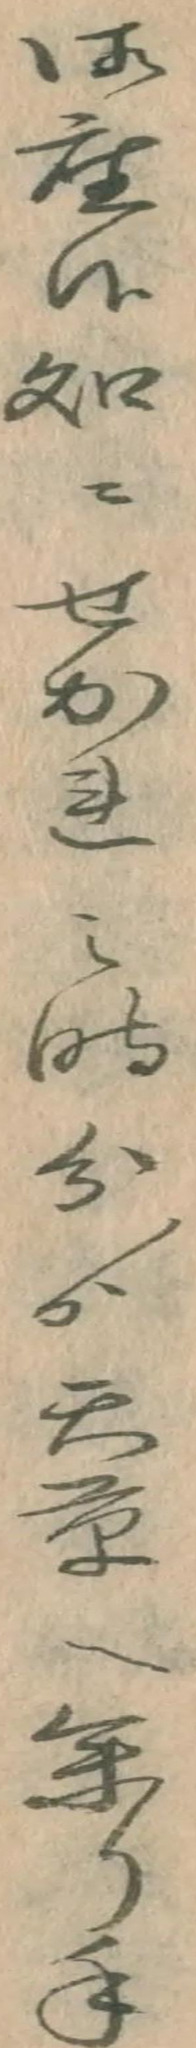御座候処にせか連之時分ゟ天草へ参り手
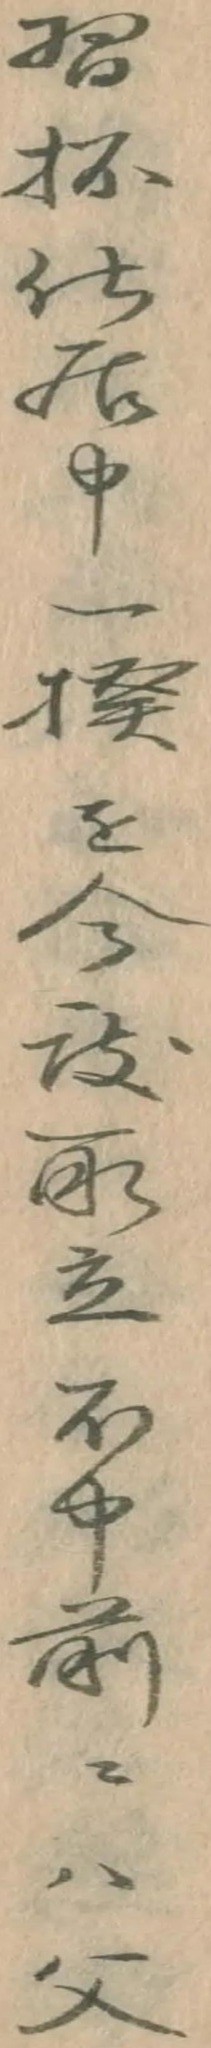習抔仕居申一揆を今度取立不申前には父

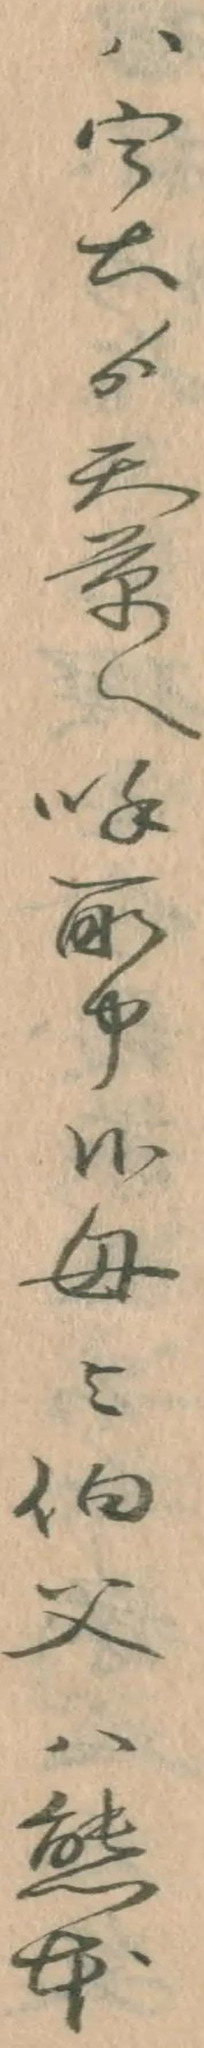は宇土ゟ天草へ呼取申候母与伯父は熊本
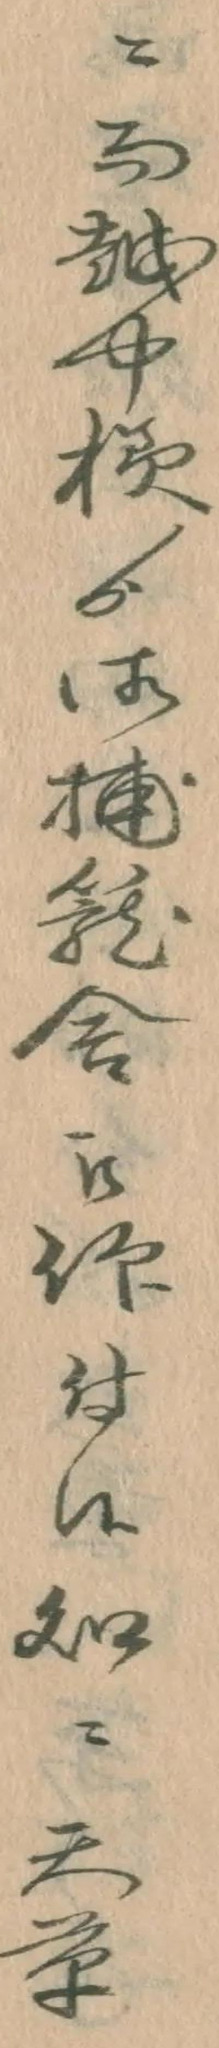に而越中様ゟ御捕籠舎被仰付候処に天草
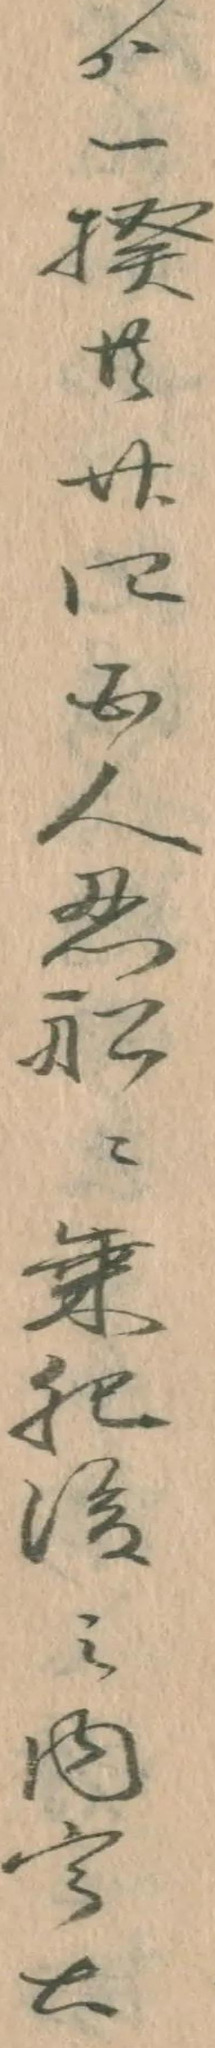ゟ一揆共廿四五人忍舩に乗肥後之内宇土
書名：切支丹御退治記 49巻. [4]
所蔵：国立国会図書館 National Diet Library, JAPAN
